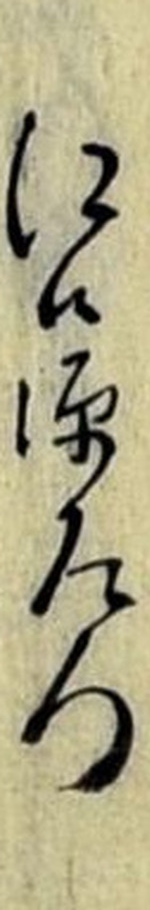江口源左衛門
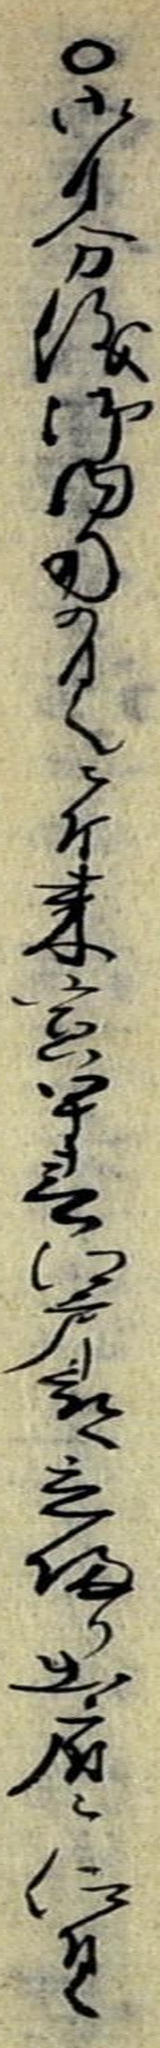○御自分儀御内用有之に付来寅早春江戸表へ立帰り出府被仰付候
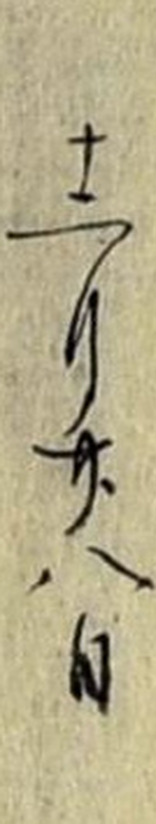十二月廿八日
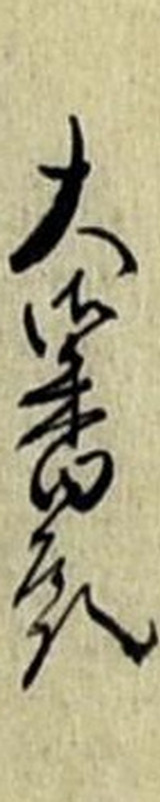大御番頭
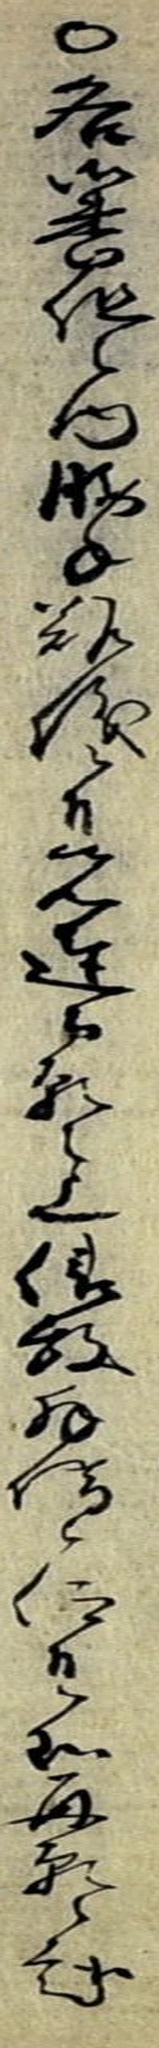○各御番組之内勝手難儀に付先達而願之上俵数拝借被仰付候処再願之趣
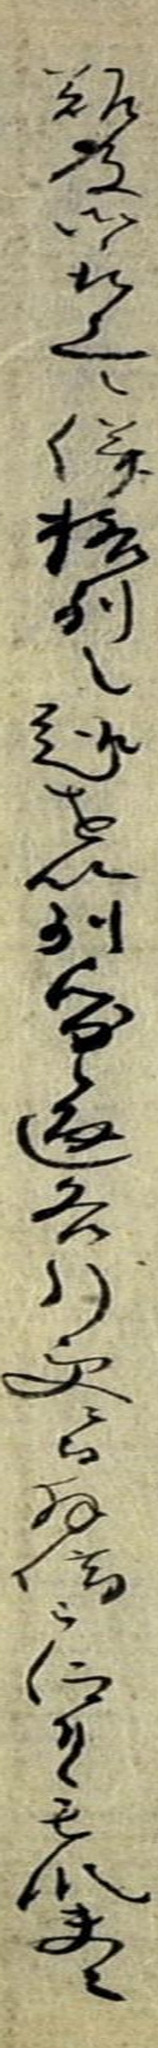難及御取上候併格別之趣を以別紙之通各引受に而拝借被仰付候其段夫々
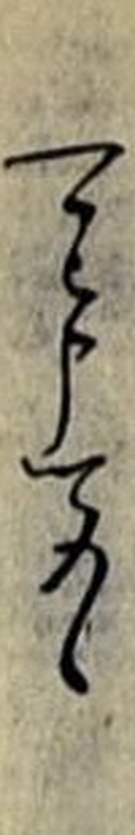可被申聞候
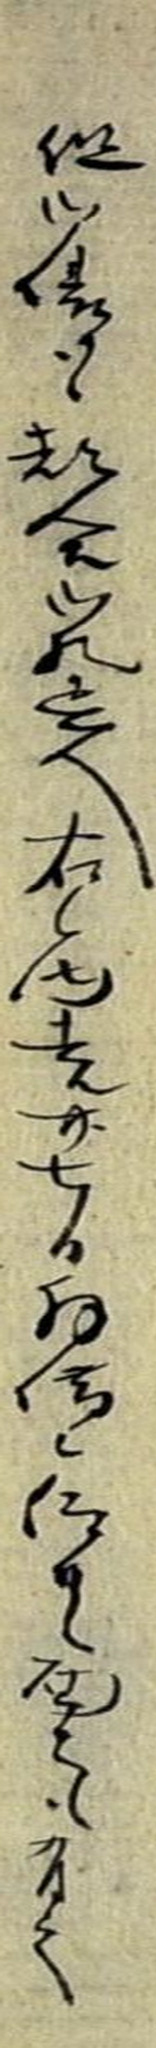但弐俵ツゝ都合弐拾壱人右之内去廿七日拝借被仰付候面々も有之
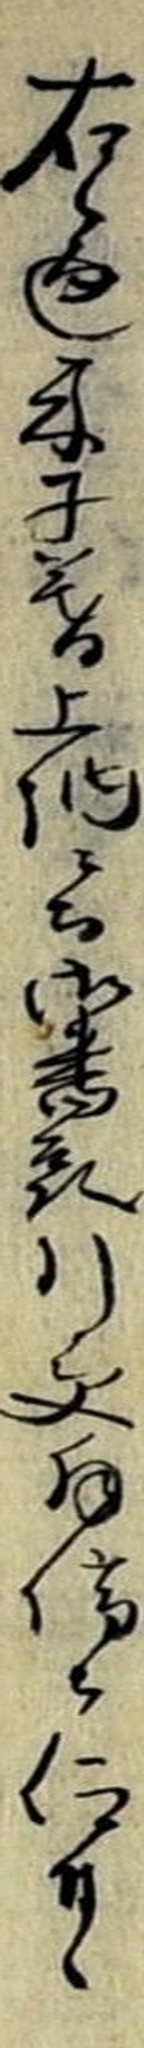右之通来子暮上納に而御番頭引受拝借被仰付候
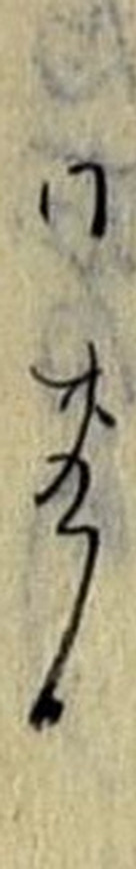同廿九日
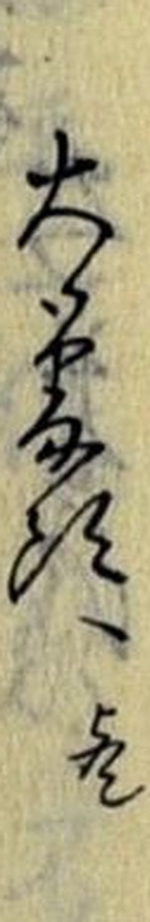大御番頭へ歟
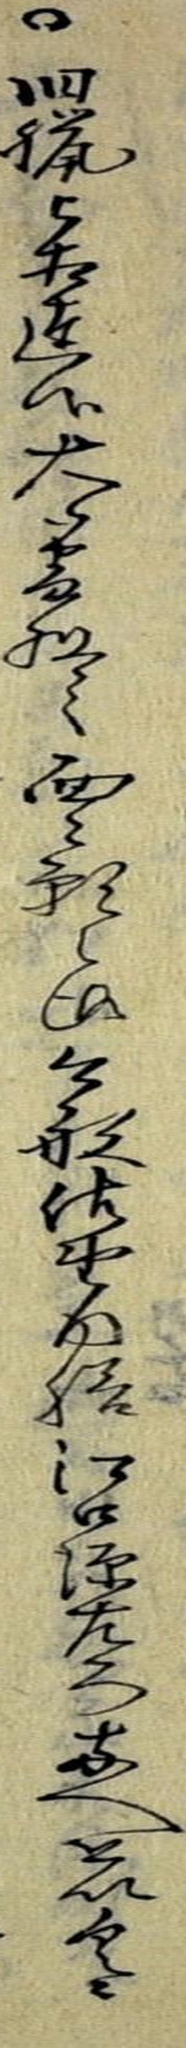○旧臘被相達候大御番組之面々願之趣今般佐野内膳江口源左衛門両人を以色々
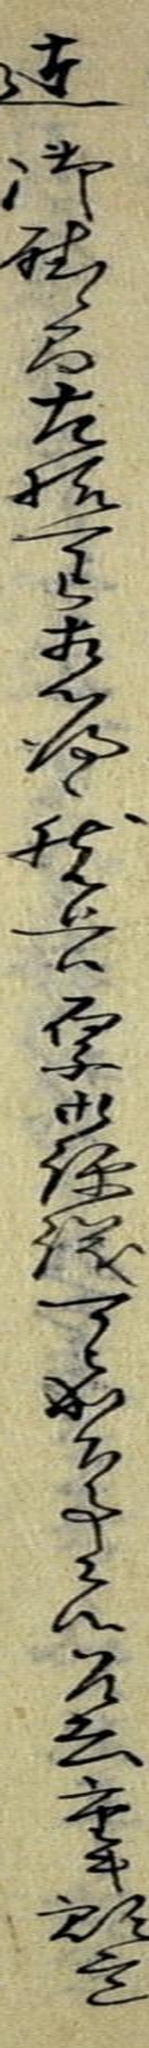達御聴候間左様可相心得候然上は厚御評議可被成下候乍去重キ願意
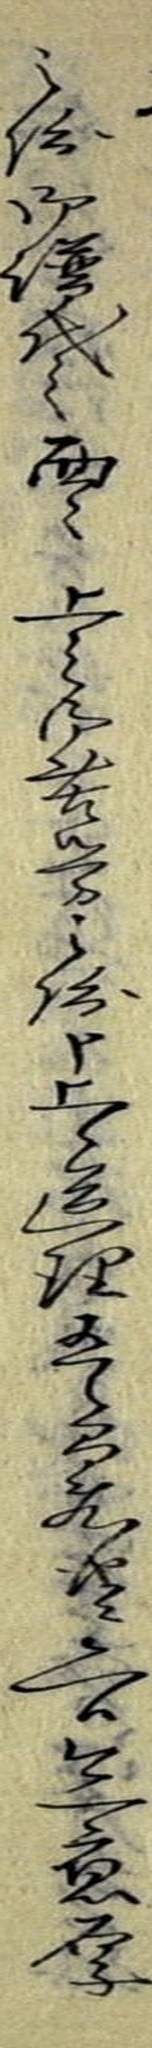之儀御譜代之面々上之御苦労之儀申上候道理有之間敷儀に候へは今一応厚
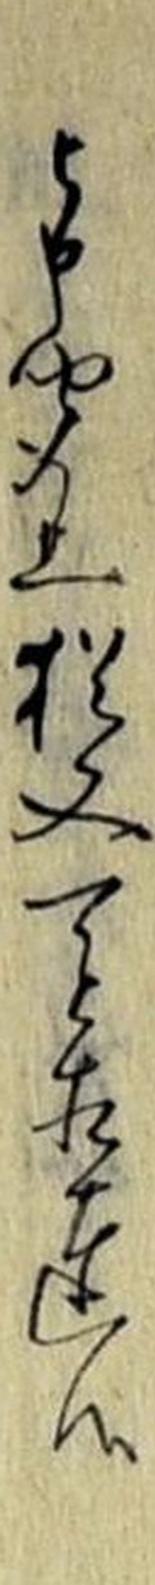被申聞上猶又可被相達候
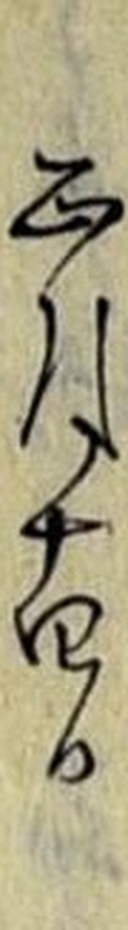正月十四日
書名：命令之部 四
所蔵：福井県文書館 Fukui Prefectural Archives
